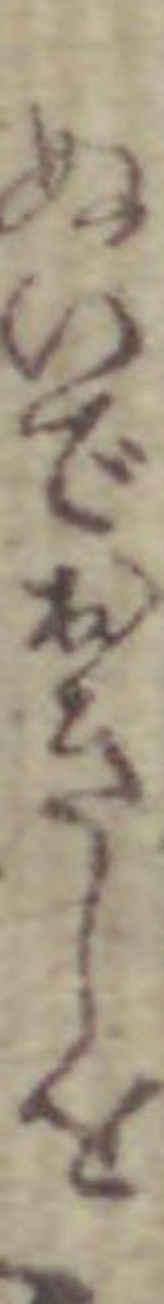ぬいでおきしを
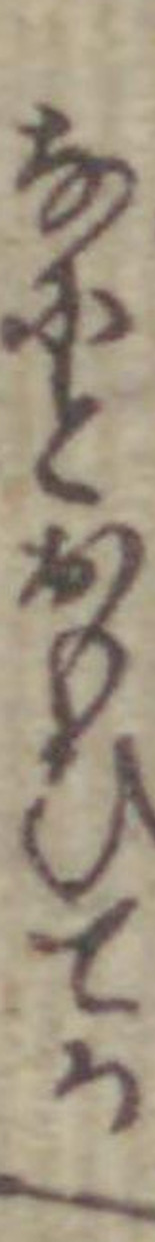なにとおもひてか
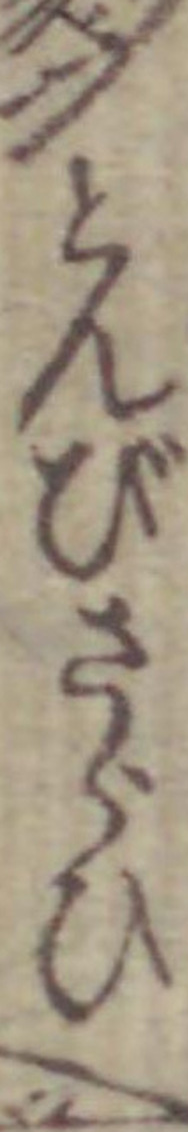とんびさらひ

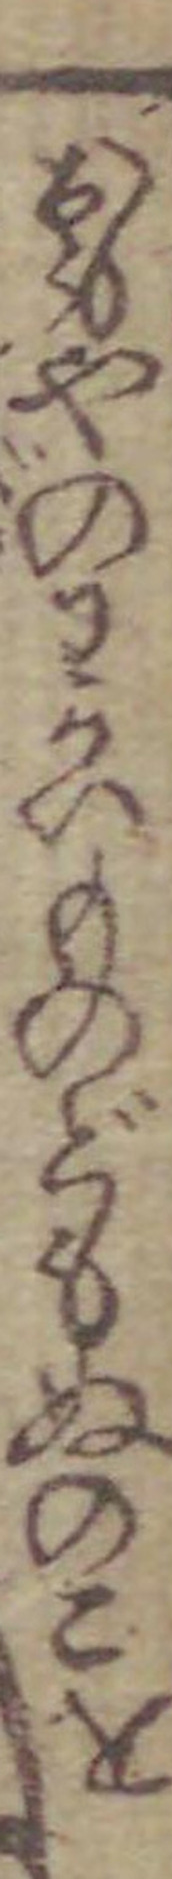おもやのわかいものどもぬのこを
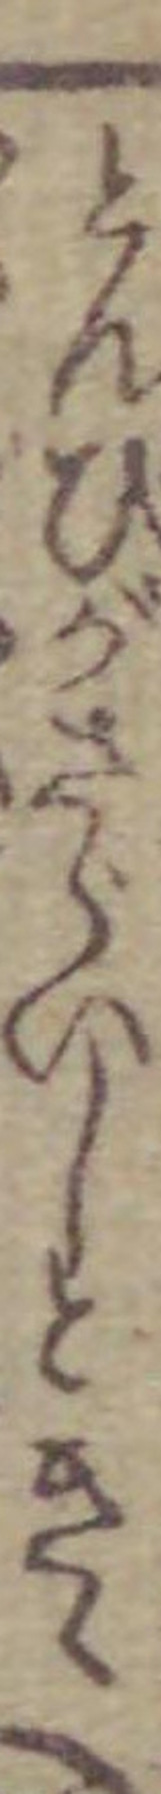とんびがさらいしときゝ
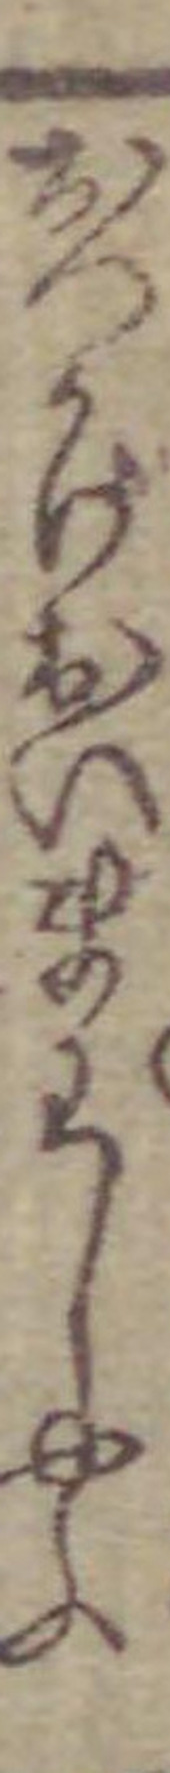おつかけおいまわしやふ
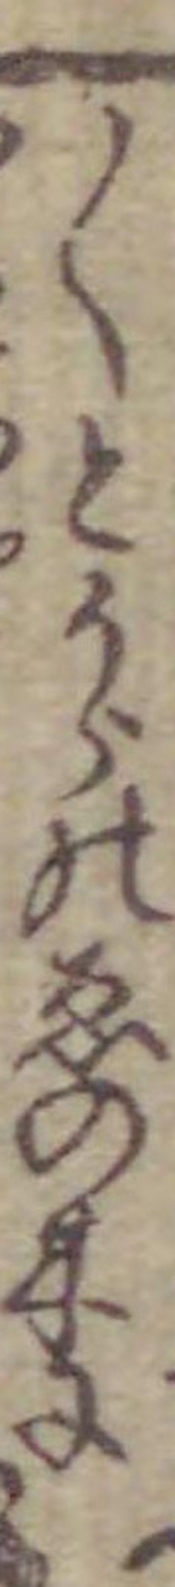〳〵とうらのゑの木に
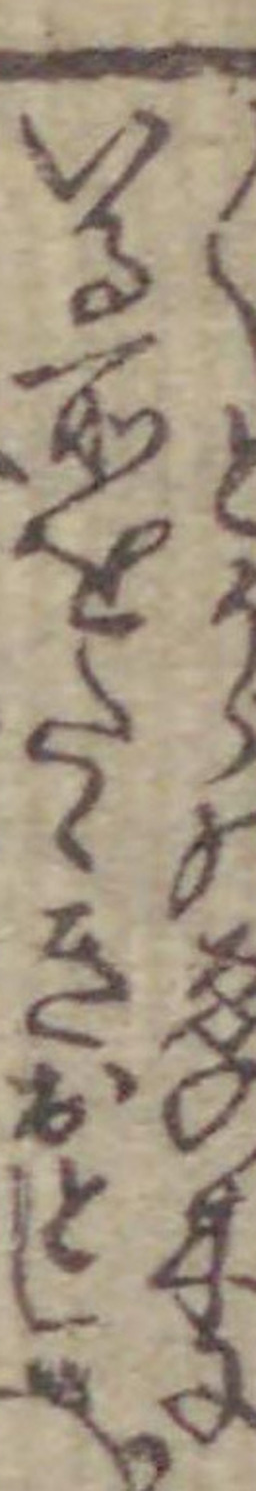いる所をたゝきおとし
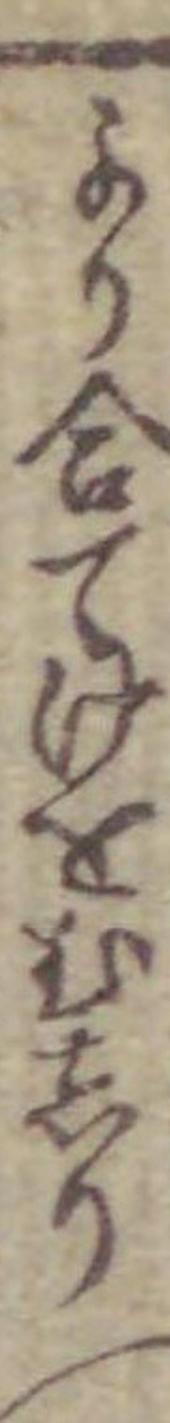より合てけをむしり
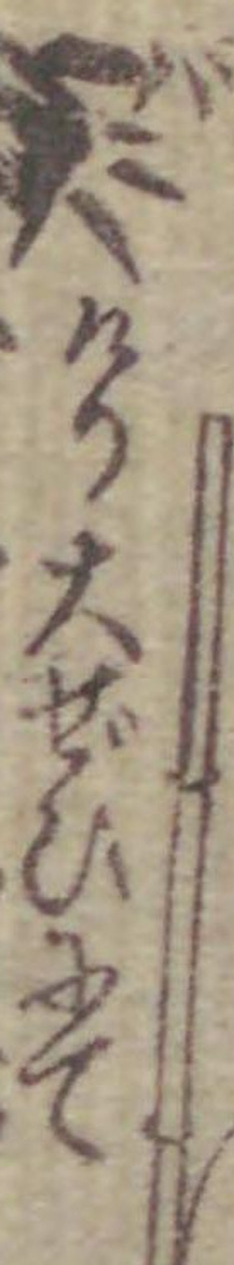けり大ぜひにて
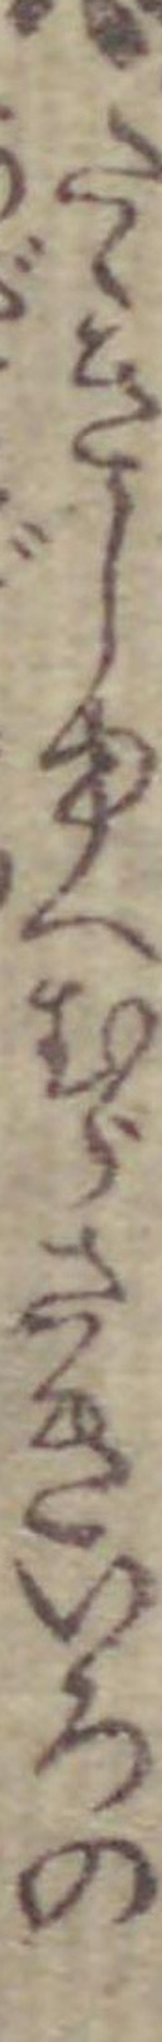たゝきしゆへむらさきいろの
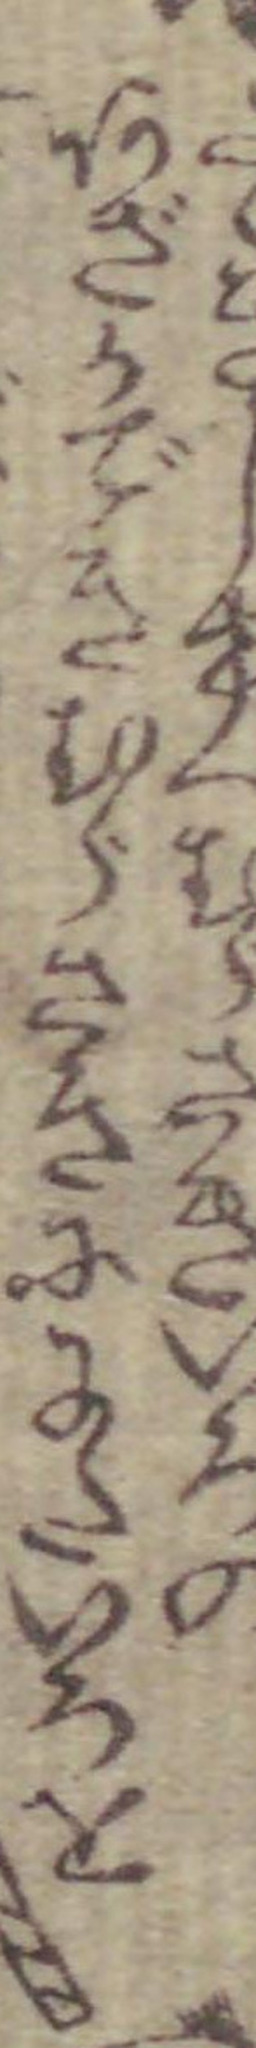あざかできむらさきににたいろを
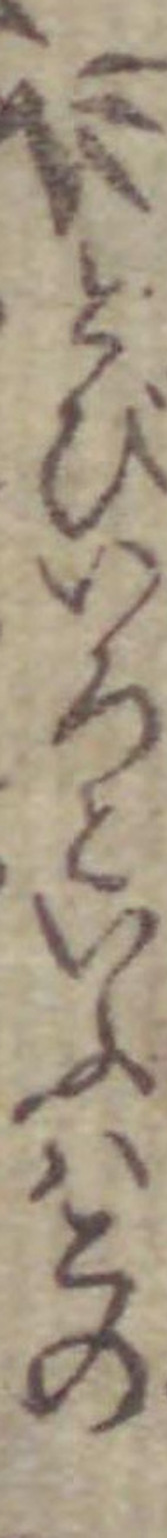とびいろといふはこの
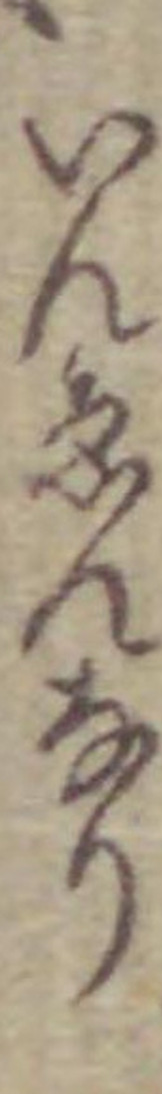いんゑんなり
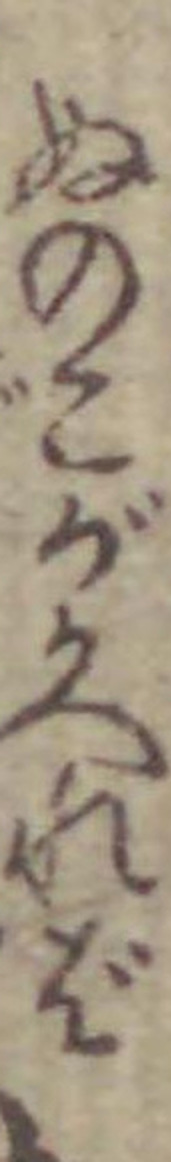ぬのこがかへれば
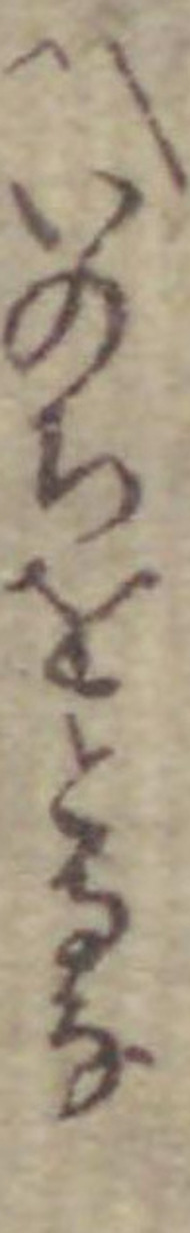〽いのちをとるな
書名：親父布子鳶握 3巻
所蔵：国立国会図書館 National Diet Library, JAPAN
